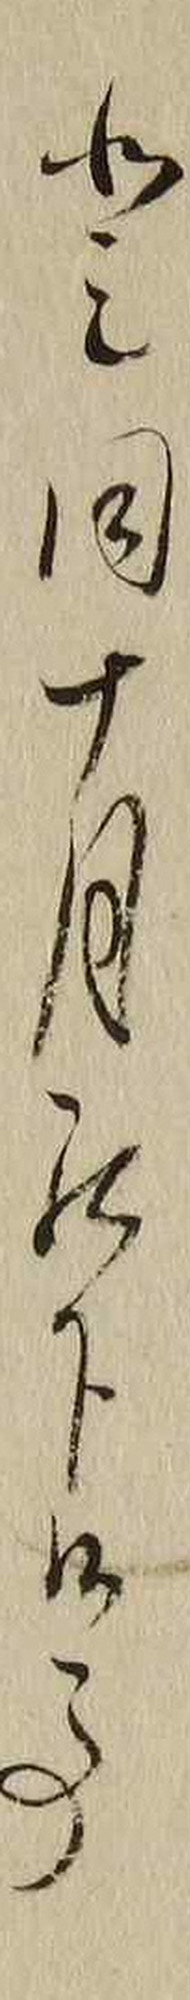登同十月罷下候事
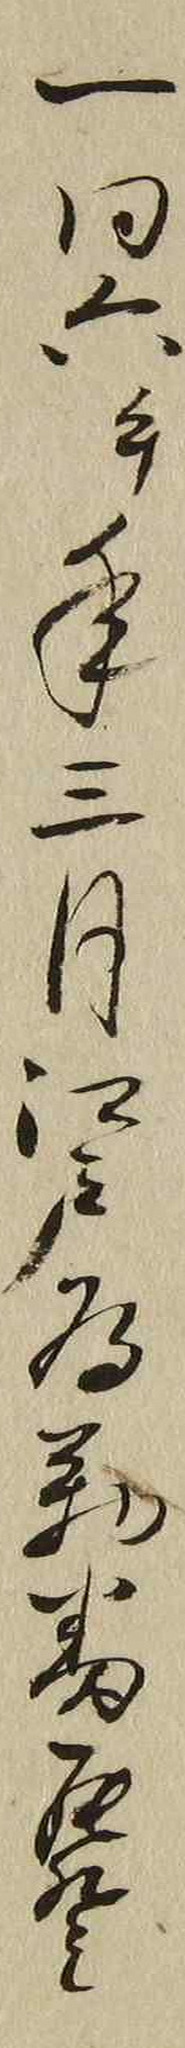一同六午年三月江戸為勤番罷登
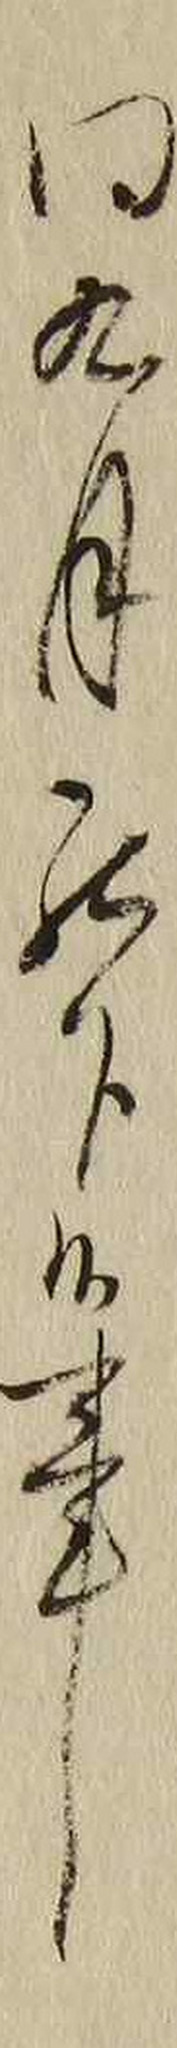同九月罷下候事
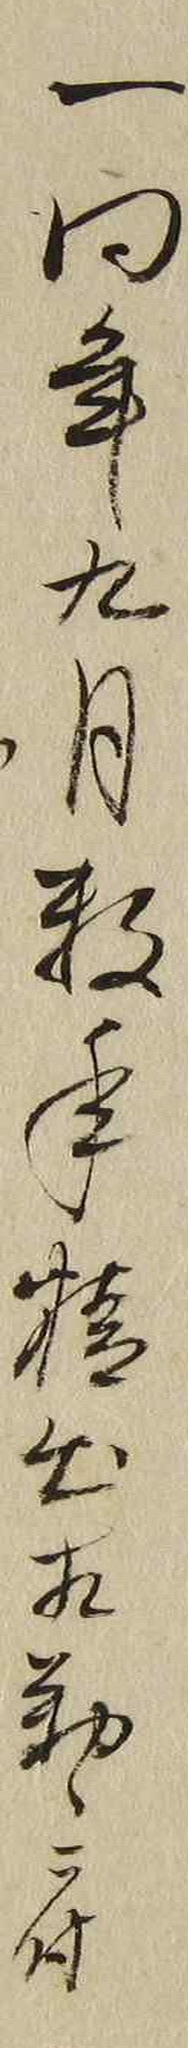一同年九月数年精出相勤候ニ付
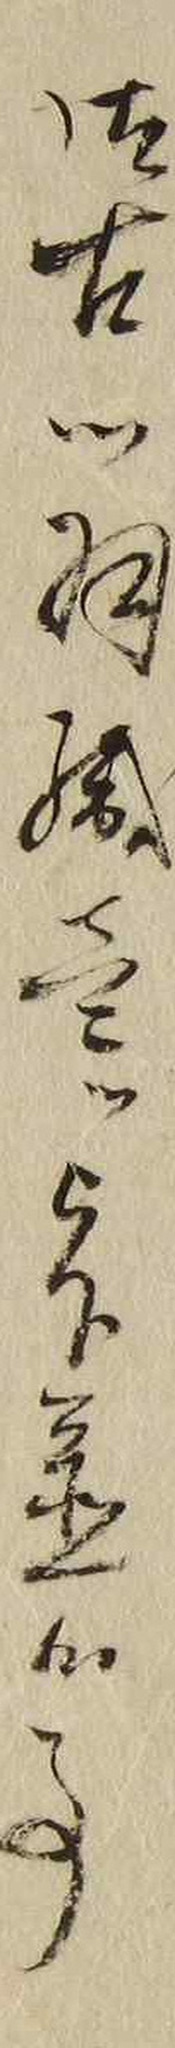御古御羽織壱ツ被下置候事
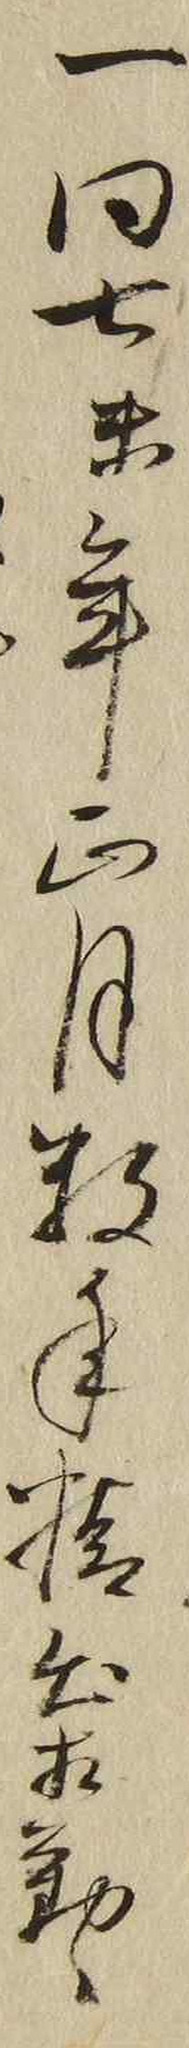一同七未年正月数年精出相勤候
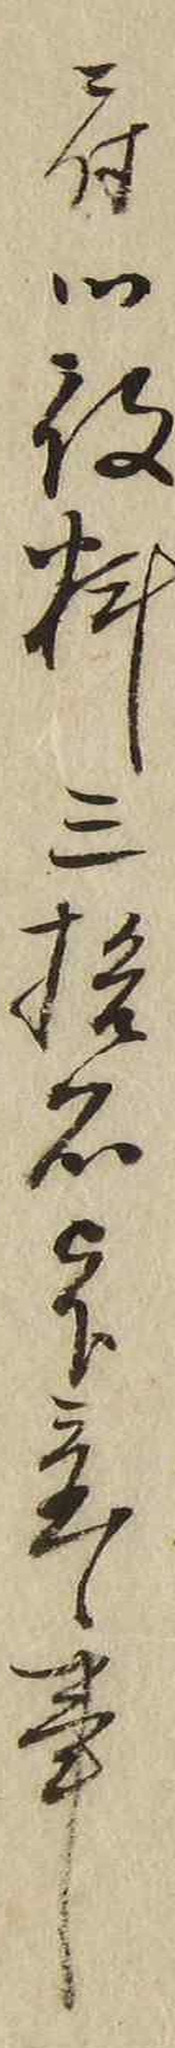ニ付御役料三拾石被下置候事

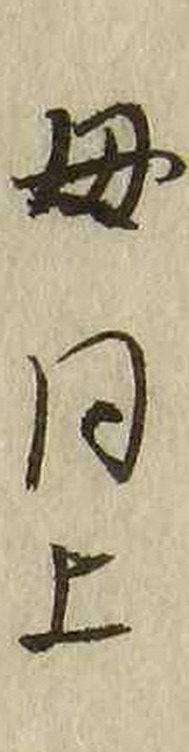母同上
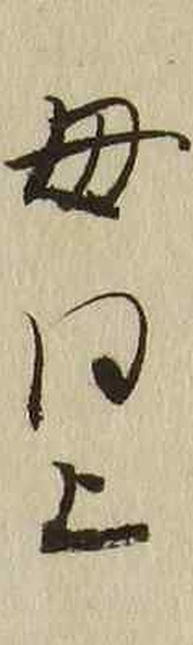母同上
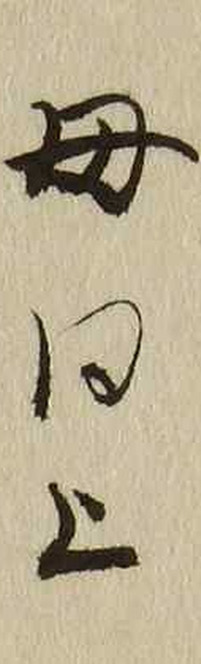母同上
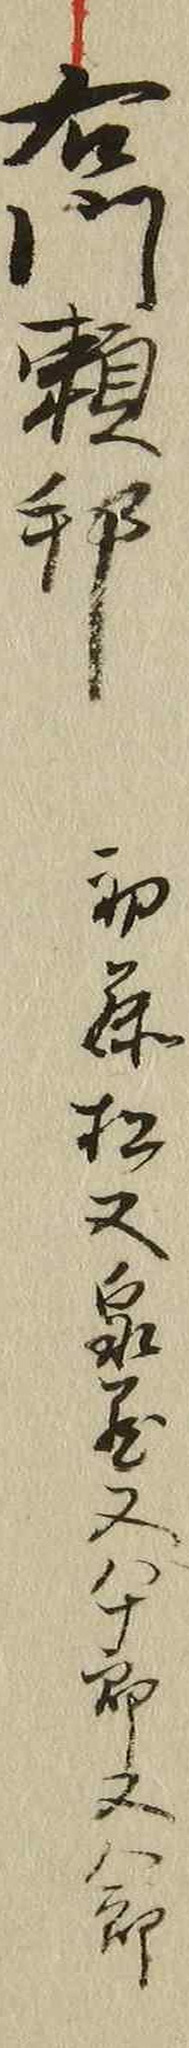右門頼邦初藤松又泉蔵又八十郎又八郎
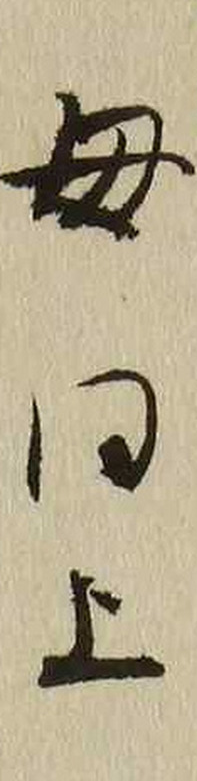母同上
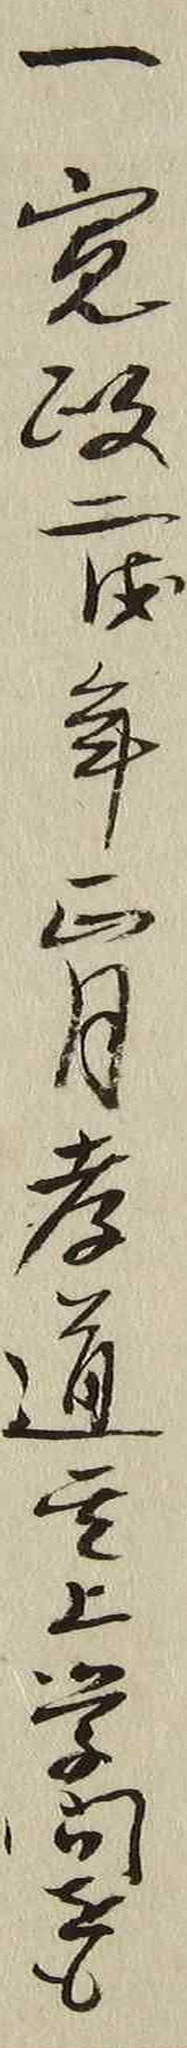一寛政二戌年正月孝道其上学問をも
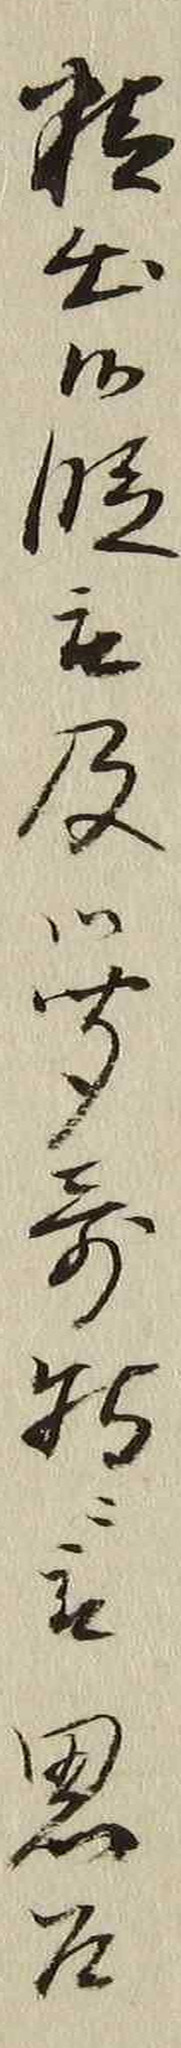精出候段被及御聞奇特ニ被思召
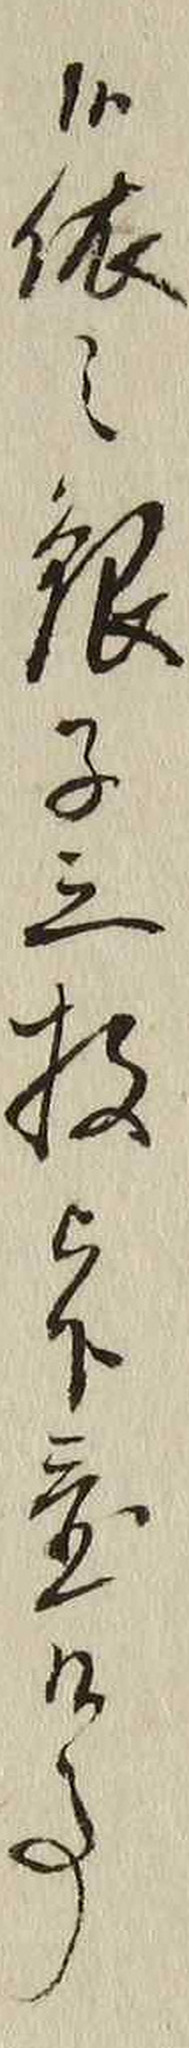候依之銀子三枚被下置候事
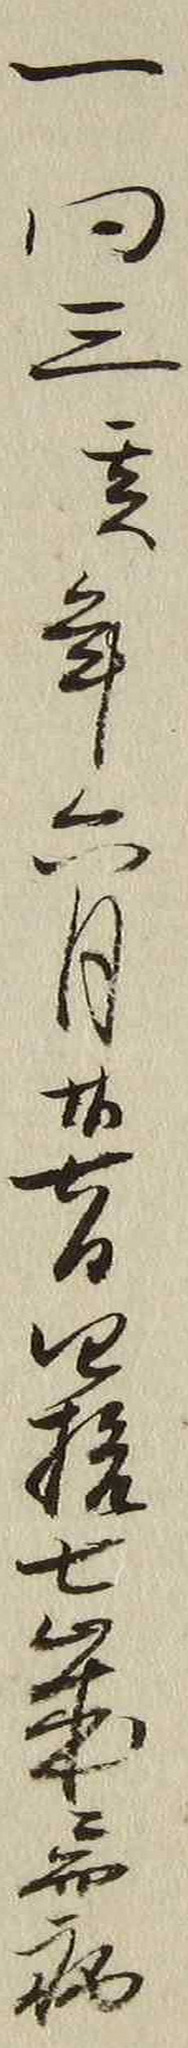一同三亥年六月廿七日四拾七歳ニ而病
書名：諸士系譜　巻之359　す之部9
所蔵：会津若松市立会津図書館
